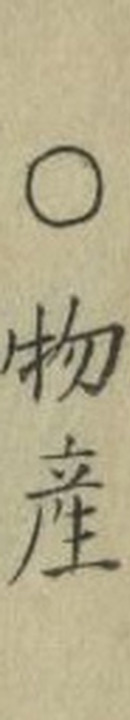〇物産

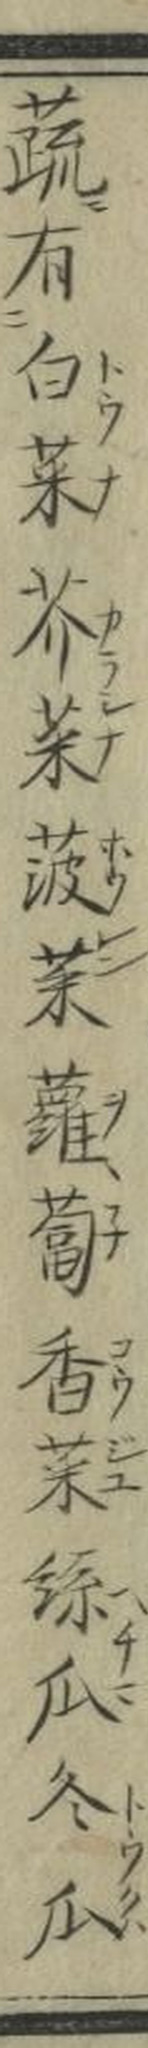蔬有白菜芥菜菠菜蘿、蔔香菜絲瓜冬瓜
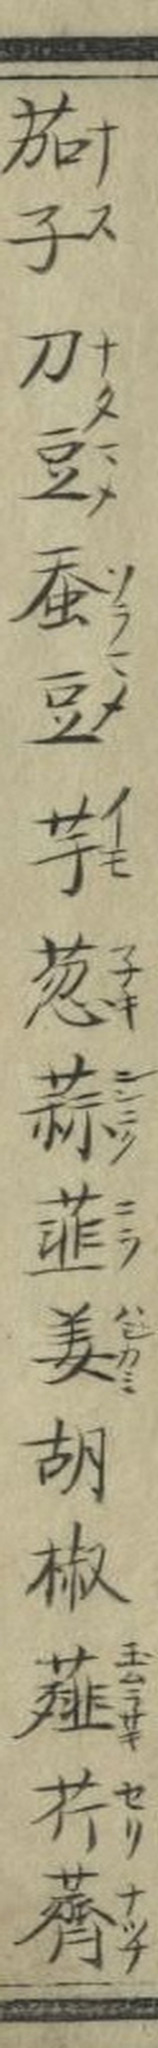茄子刀豆蚕豆芋葱蒜韮姜胡椒薤芹萕
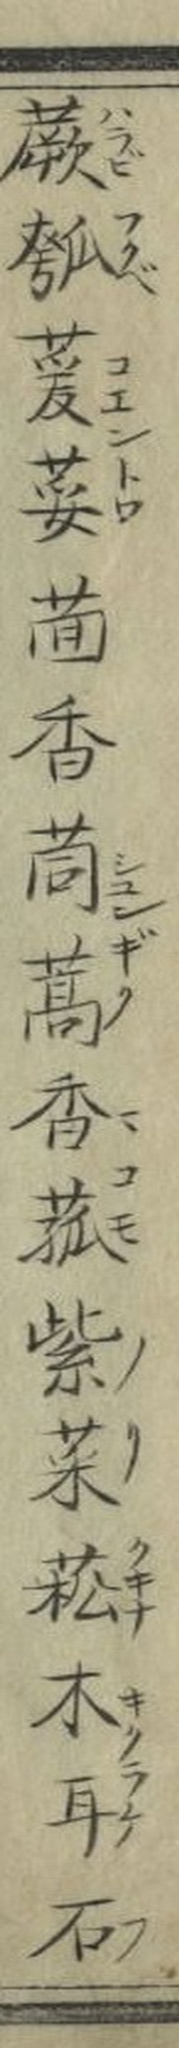蕨瓠萲荽茴香茼蒿香菰紫菜菘木耳石

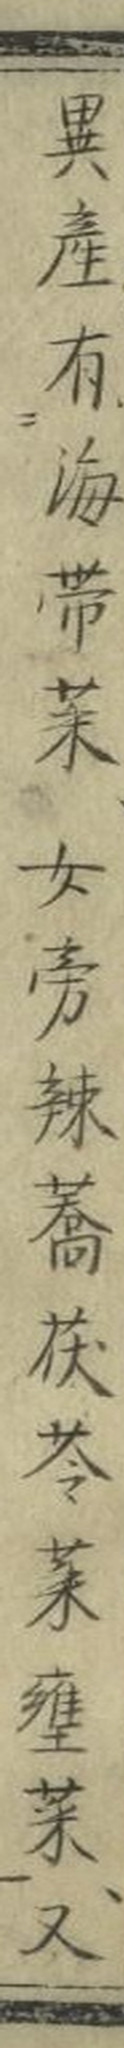異産有海帯菜、女旁辣蕎茯苓菜壅菜、又

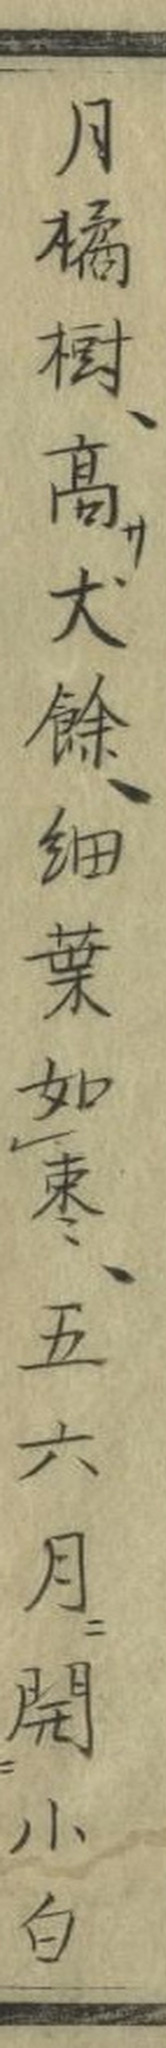月橘樹、髙丈餘、細葉如棗、五六月開小白
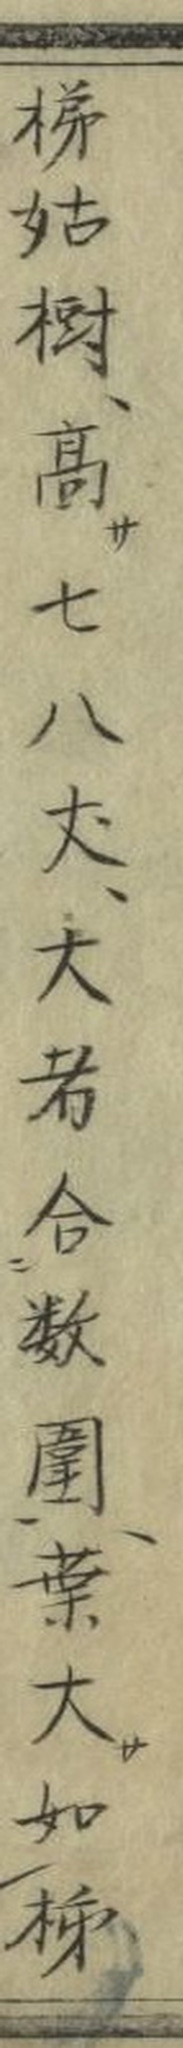梯姑樹、髙七八丈大者合数圍、葉大如柹
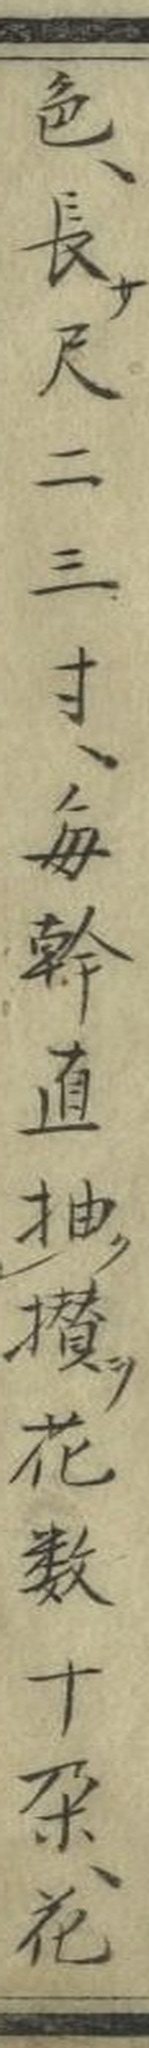色、長尺二三寸、毎幹直抽攢花数十朶、花

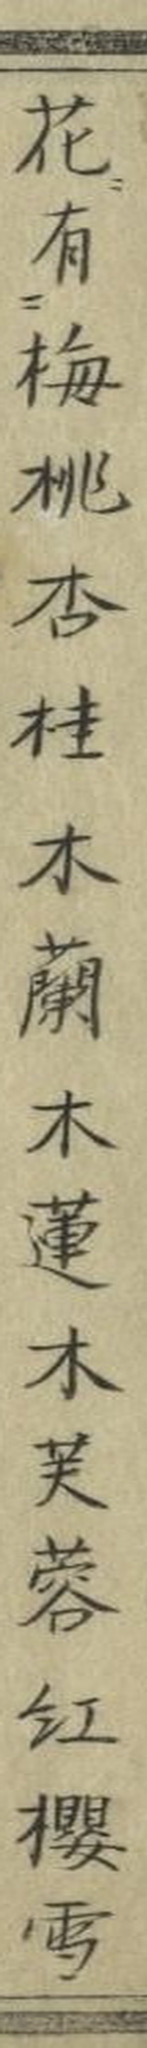花有梅桃杏桂木蘭木蓮木芙蓉紅櫻雪

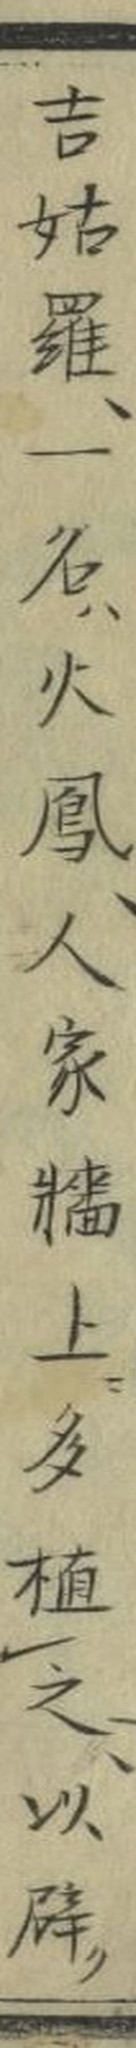吉姑羅、一名火鳳、人家牆上多植之、以辟

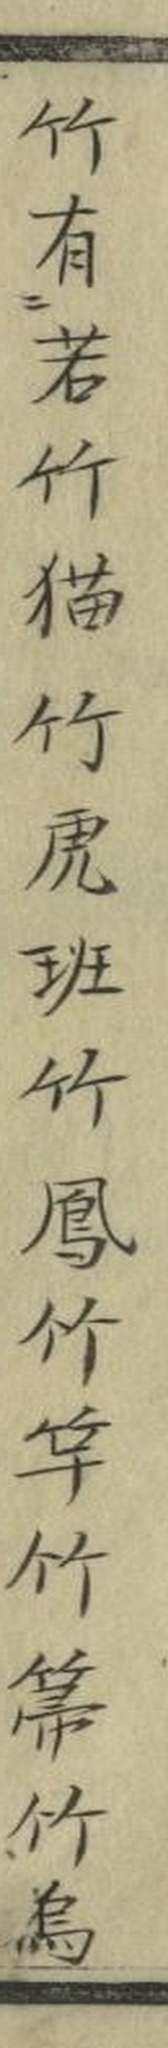竹有若竹猫竹虎班竹鳳竹竿竹箒竹烏
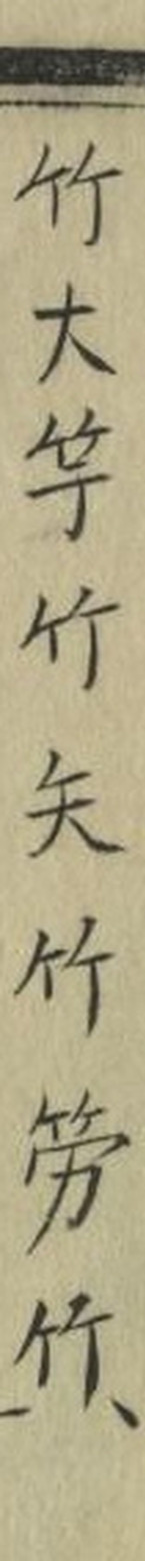竹大竿竹矢竹竹、

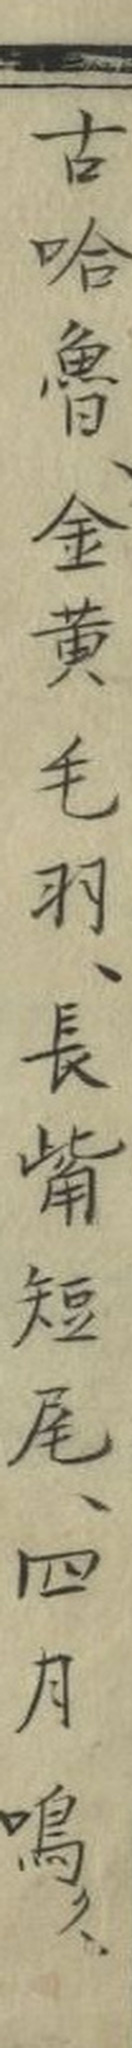古哈魯、金黄毛羽、長觜短尾、四月鳴、

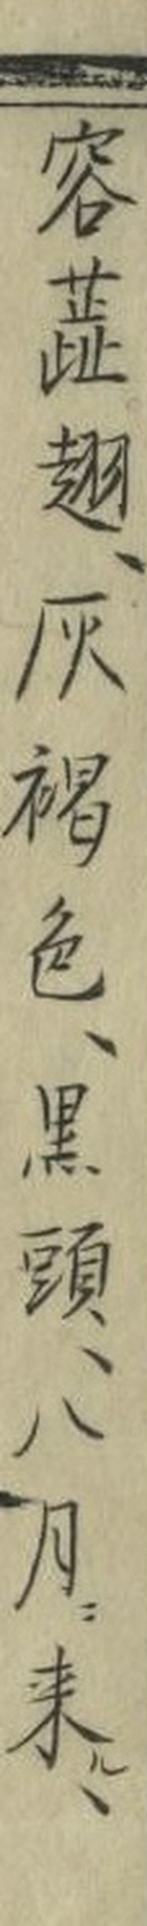容蕋翅、灰褐色、黒頭、八月来、

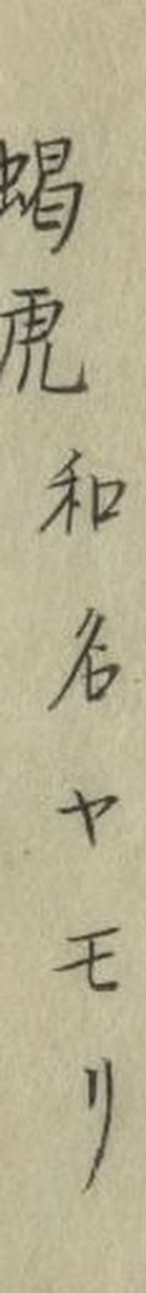蝎虎和名ヤモリ

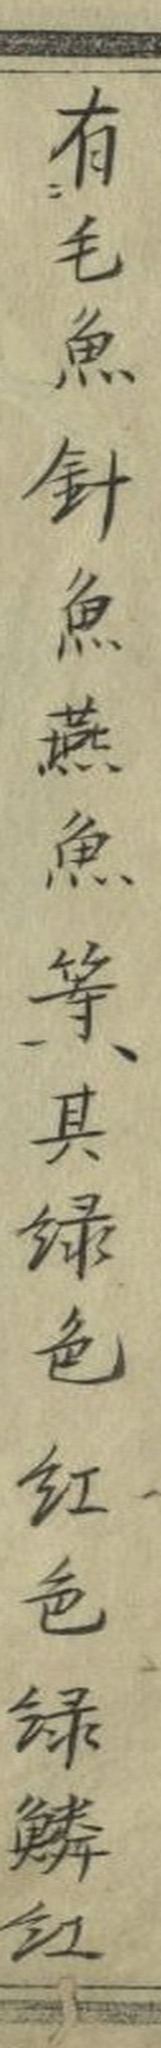有毛魚針魚燕魚等、其緑色紅色緑鱗紅
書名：中山伝信録物産考 地
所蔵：University of the Ryukyus Library
